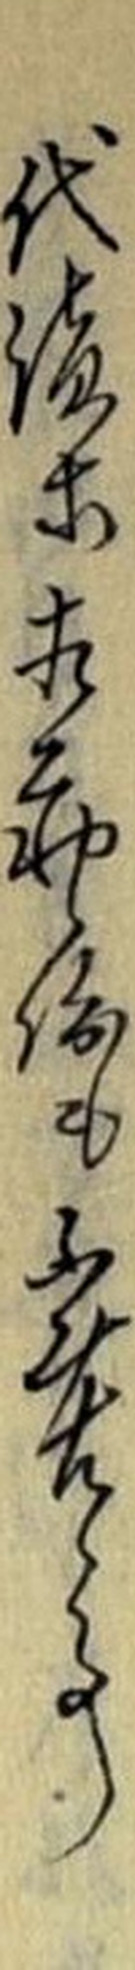代講等相勤候儀も不苦候事
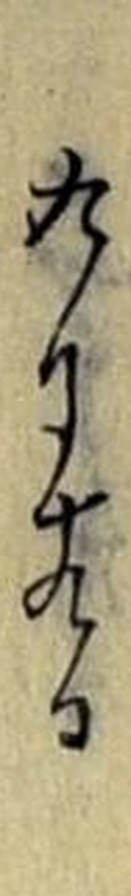九月十九日
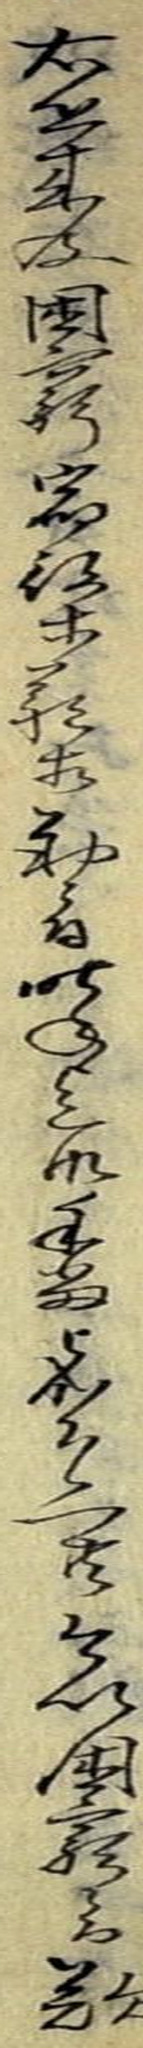○右近来及困窮宿役等難相勤に付昨年迄御手当被成下候へ共今以困窮に而歎
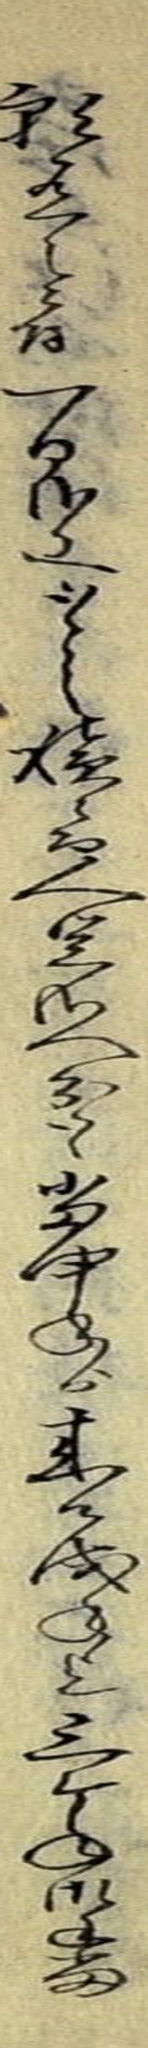願有之候に付一日弐匁つヽ之積に而人足弐人分つヽ当申年ゟ来ル戌年迄三ヶ年御手当
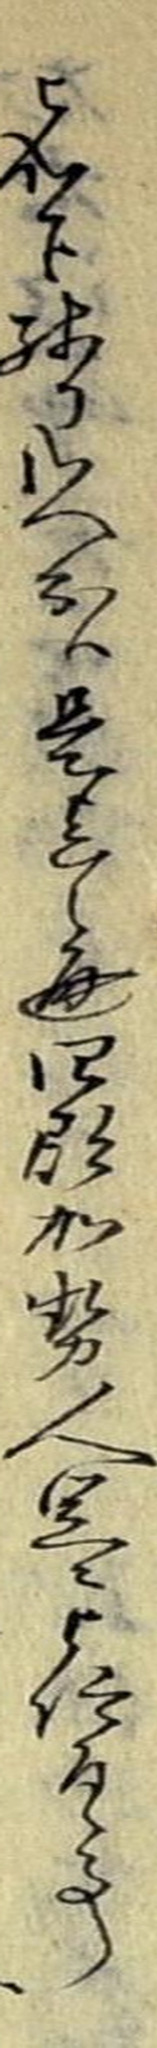被成下残り弐人分は是迄之通四郡加勢人足に被仰付候事
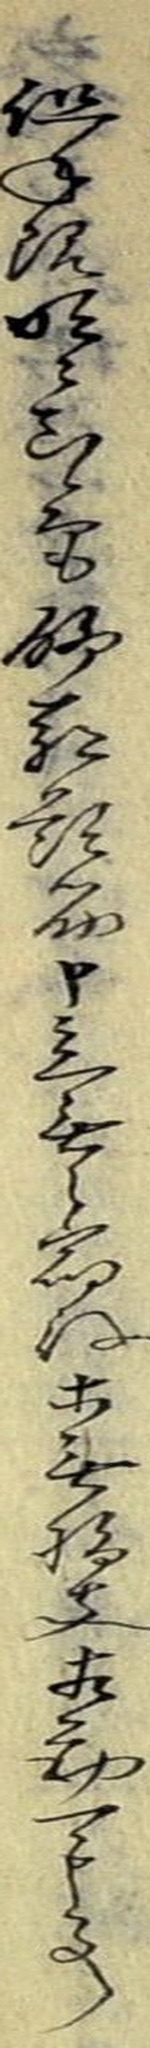但年限明に至候而も聊難題筋申立無之宿役等無指支相勤可申事
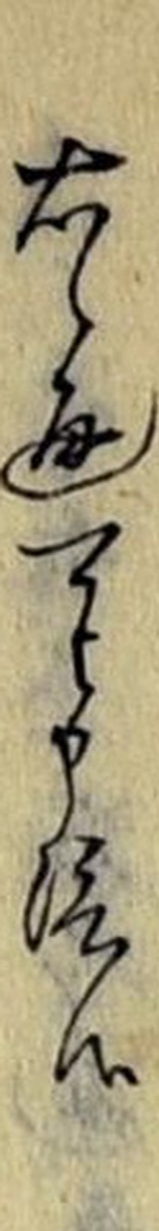右之通可被申渡候
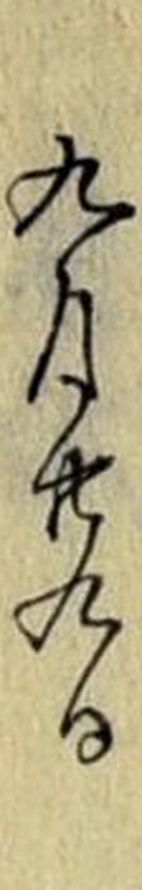九月廿九日
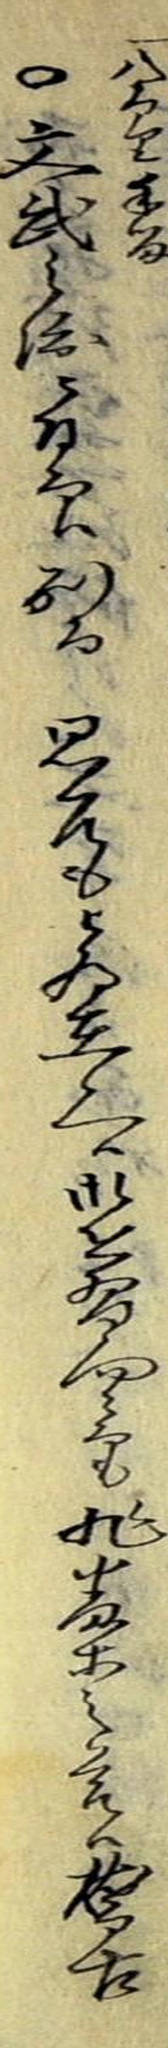○文武之儀に付而は別而思召も被為在候へは御近習向に而も非番之節は稽古

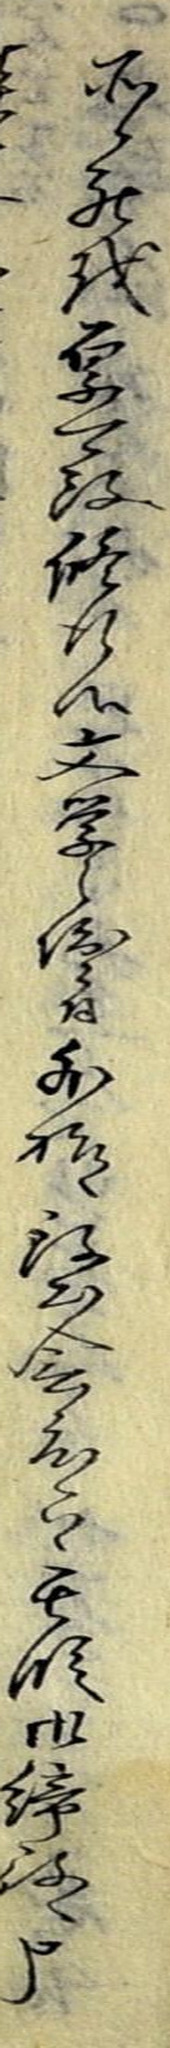所へ罷越厚可致修行候文学之儀に付外様へ致出会度高はヽ其談締役へ申
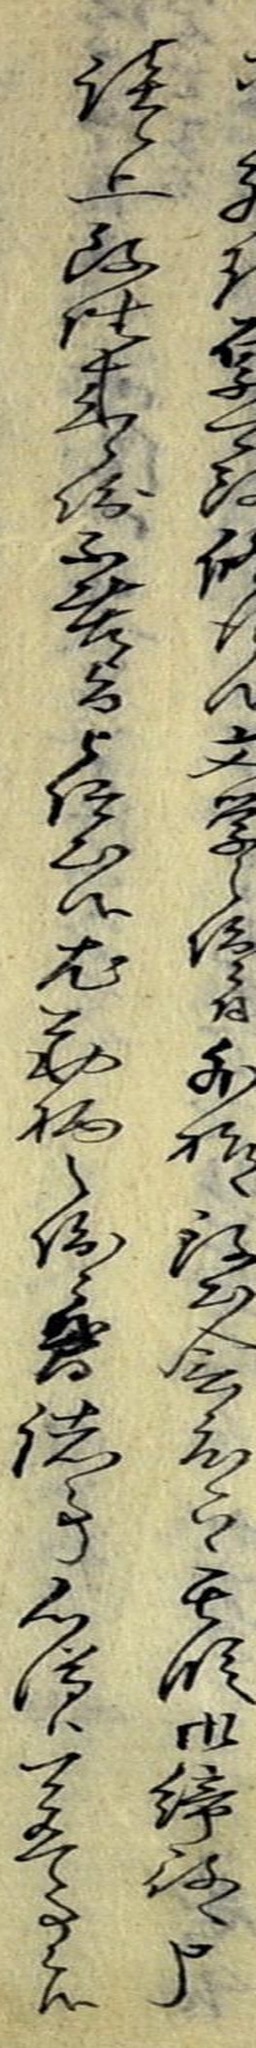談候上致往来公儀不苦旨被仰出候尤勤柄之儀に候間諸事心得は可有之候事
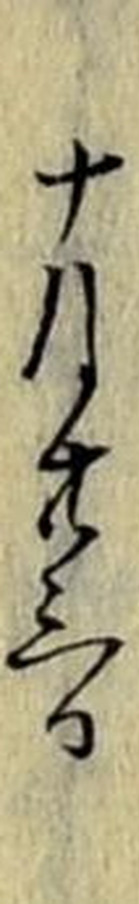十月廿三日
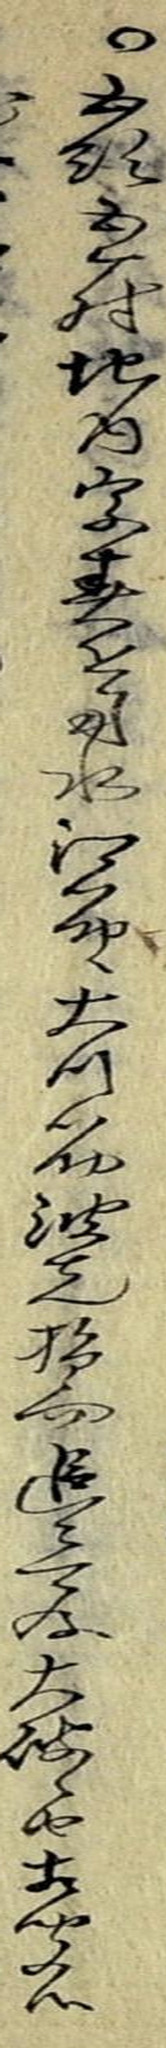○五領五ヶ村地内字春近用水江筋へ大川筋波先指向追々可及大破候由相聞候
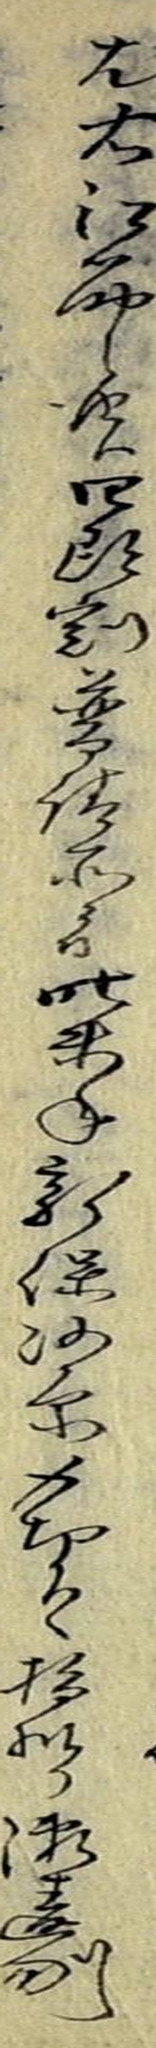尤右江筋之儀は四郡割普請所に付昨未年新保河原〆切下々指掛り瀬違刎
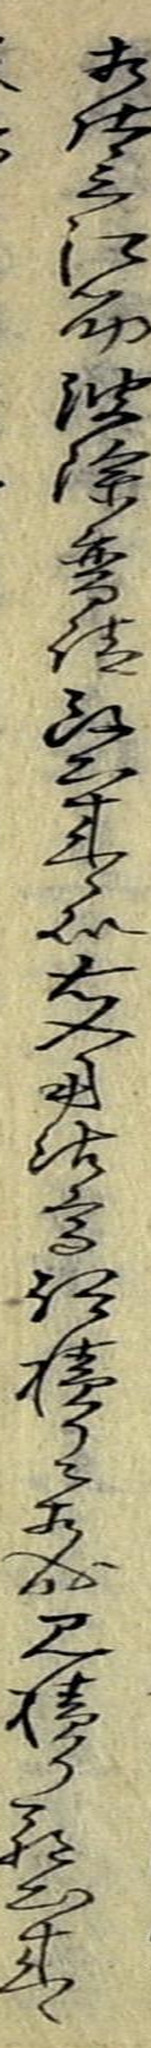相仕立江筋波除普請致出来候処右入用銀高跡積りに相成見積り難出来候
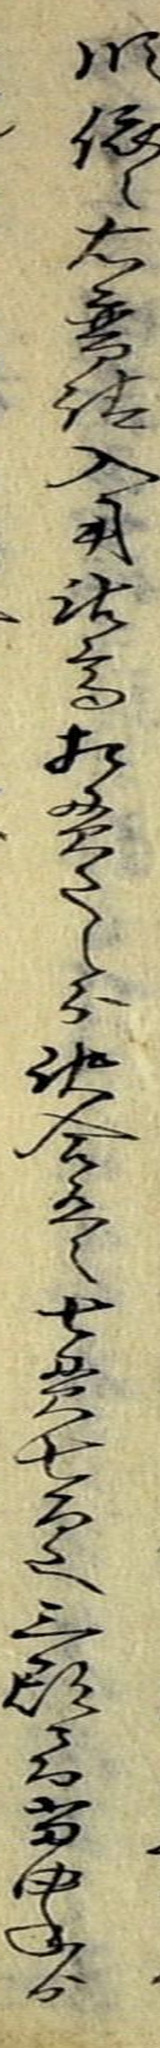段依之右普請入用銀高拾貫匁分訳合有之七貫七百匁三郡に而当申年ゟ
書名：命令之部 六
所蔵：福井県文書館 Fukui Prefectural Archives
